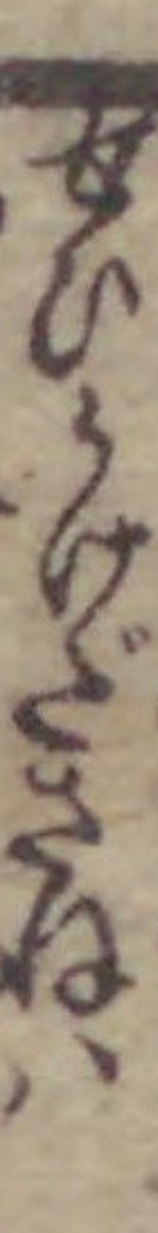ぜひうけださねは
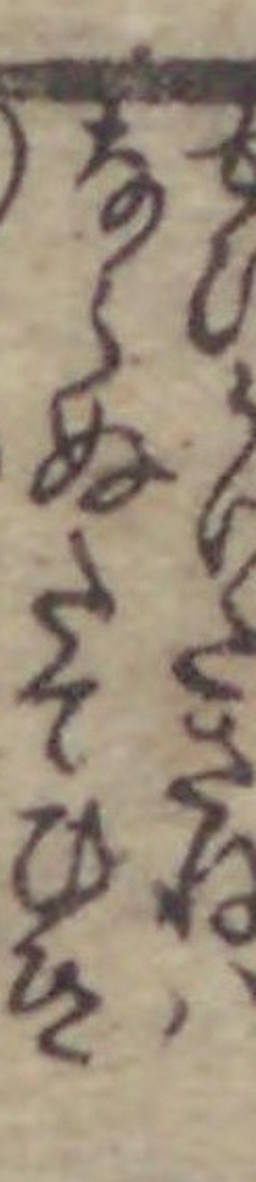ならぬたてひき
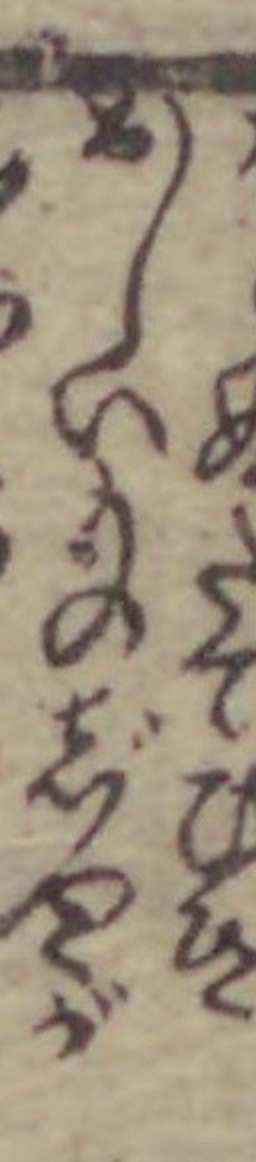おしいものじやが
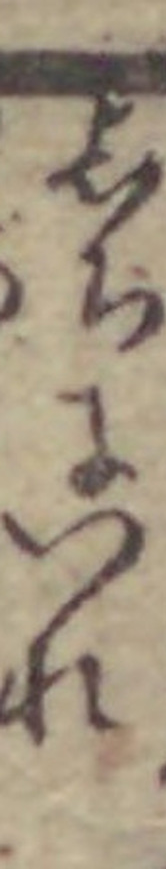しちにいれ
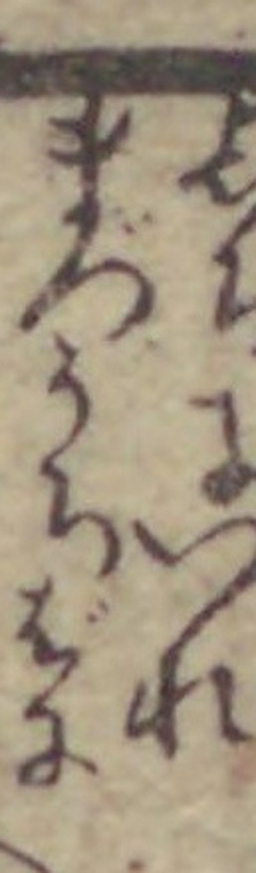まづうちばに
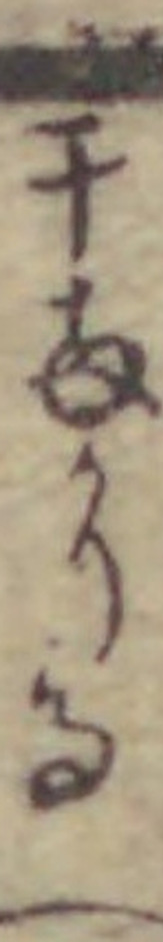千両かりる
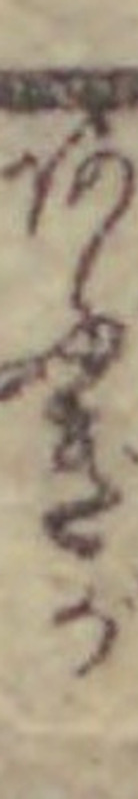あふぎが
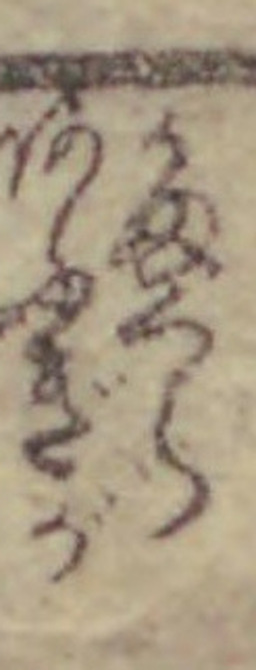あふぎが
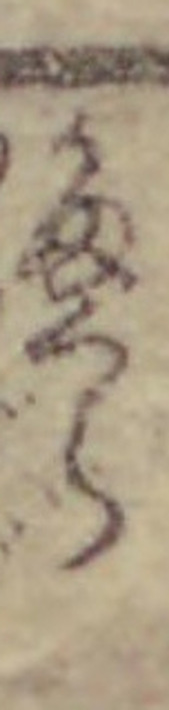かまくら
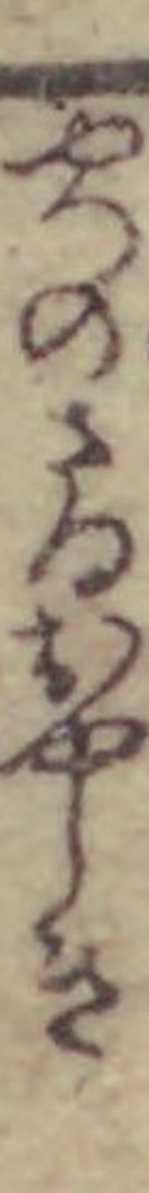やつのさるおやしき
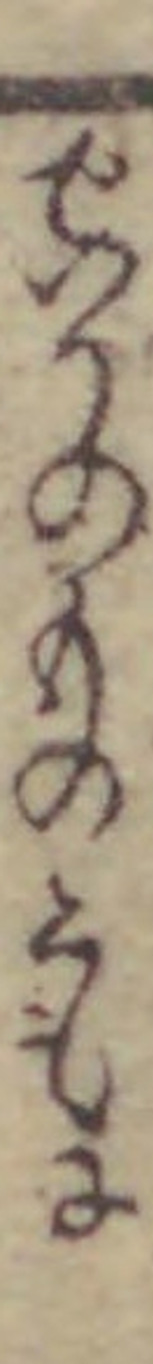でいりのものともに
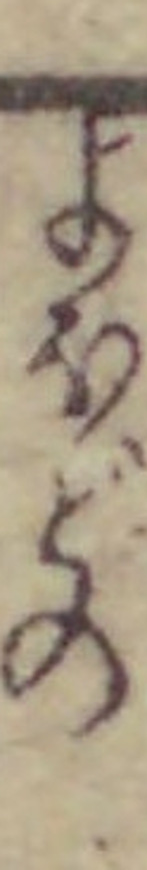よほどの
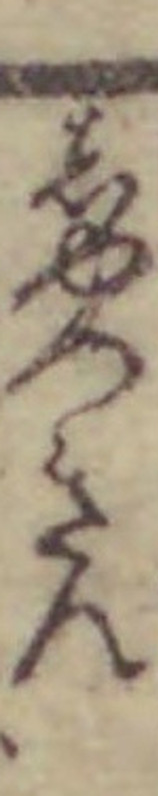しやつきん
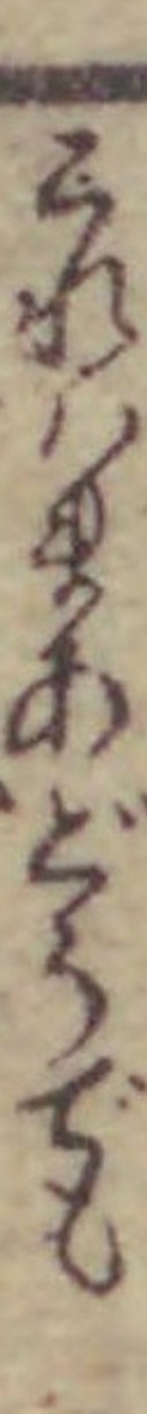これはまあどうでも
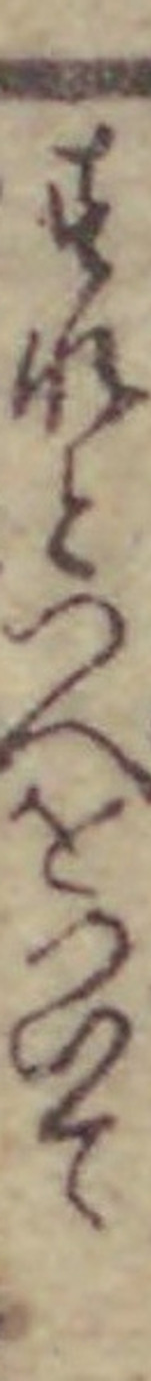すれとつへをついて
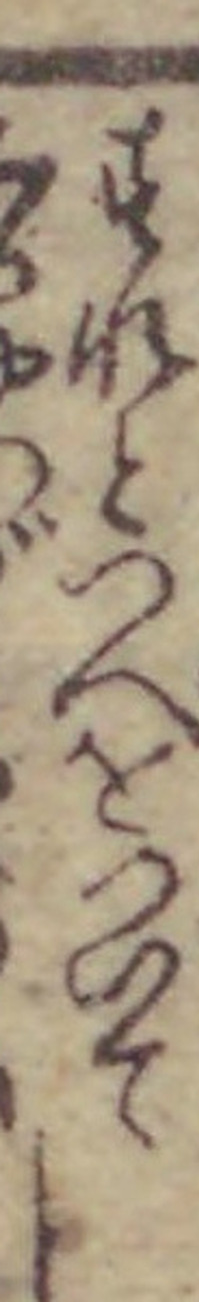すれとつへをついて
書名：御代の御寶
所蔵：国立国会図書館 National Diet Library, JAPAN
